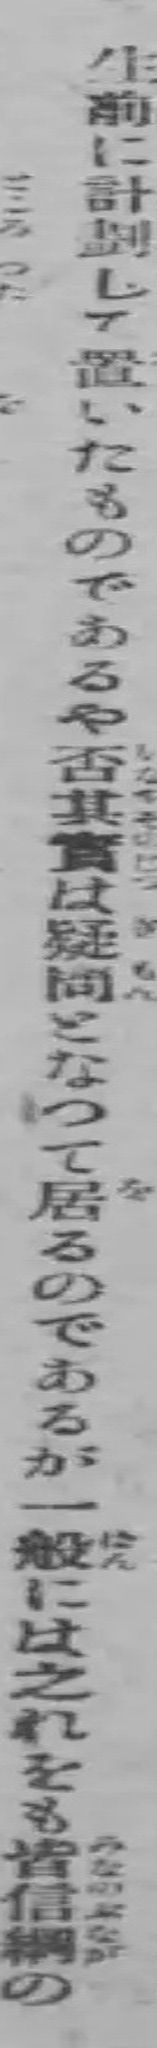生前に計劃して置いたものであるや否其実は疑問となつて居るのであるが一般には之れをも皆信綱の
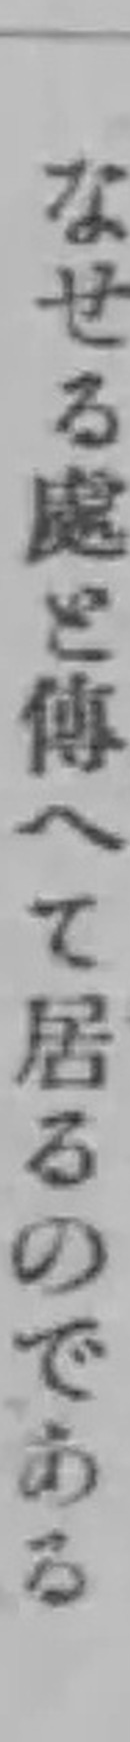なせる処と伝へて居るのである
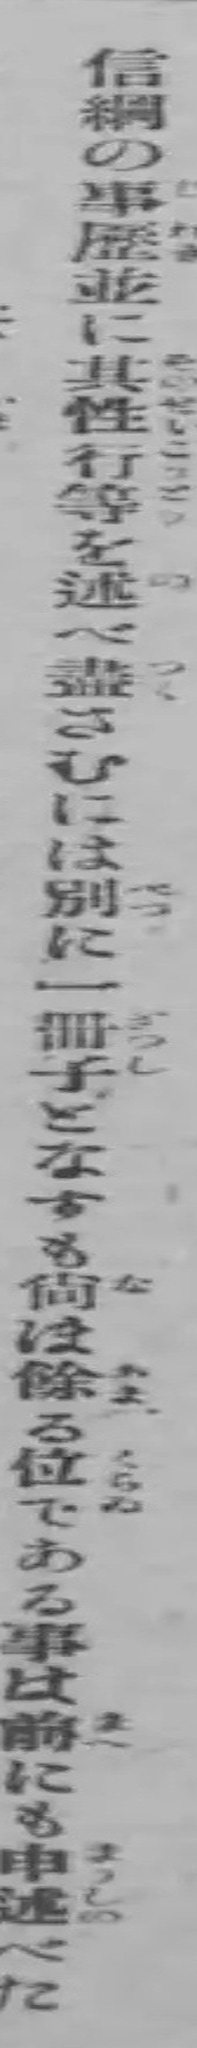信綱の事歴並に其性行等を述べ尽さむには別に一冊子となすも尚ほ余る位である事は前にも申述べた
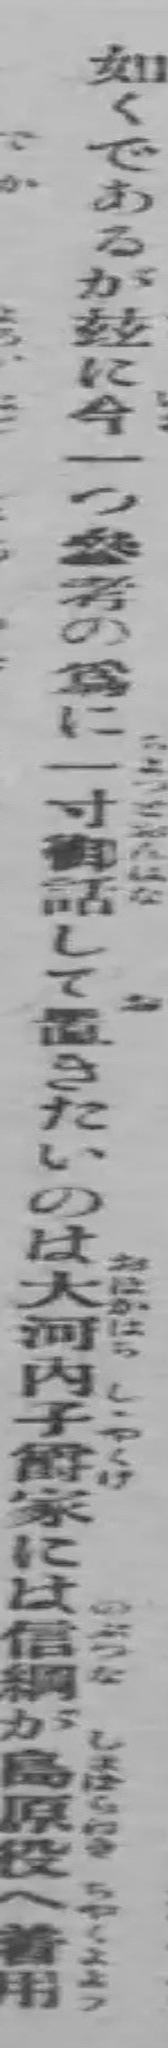如くであるが茲に今一つ参考の為に一寸御話して置きたいのは大河内子爵家には信綱が島原役へ着用
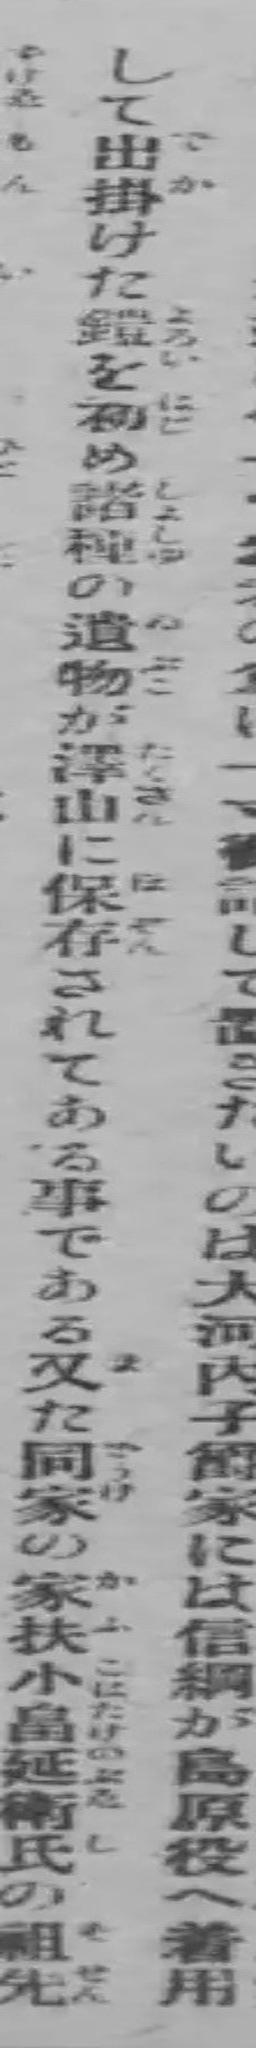して出掛けた鎧を初め諸種の遺物が沢山に保存されてある事である又た同家の家扶小畠延衛氏の祖先
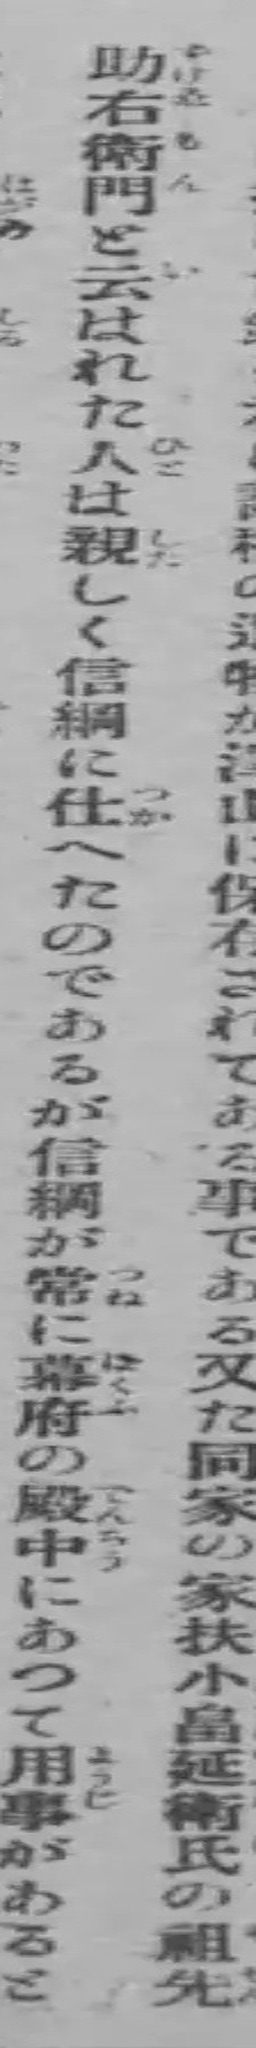助右衛門と云はれた人は親しく信綱に仕へたのであるが信綱が常に幕府の殿中にあつて用事があると
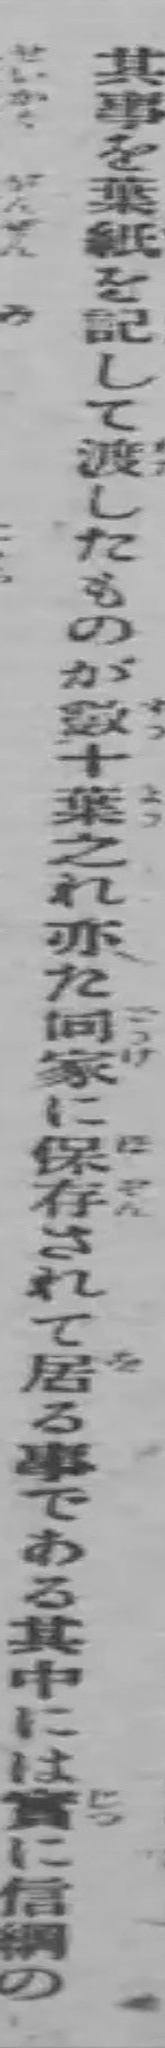其事を葉紙を記して渡したものが数十葉之れ亦た同家に保存されて居る事である其中には実に信綱の
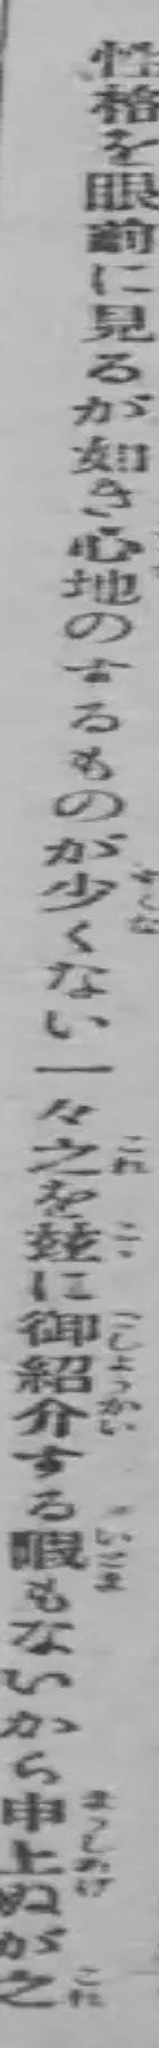性格を眼前に見るが如き心地のするものが少くない一々之を茲に御紹介する暇もないから申上ぬが之
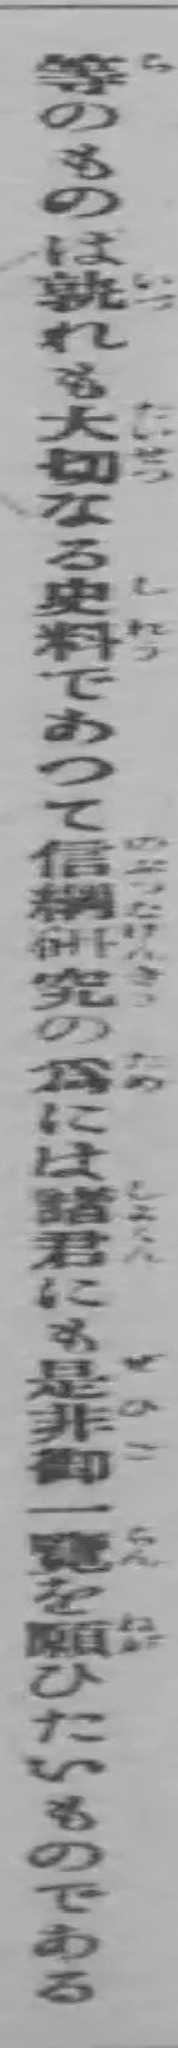等のものは孰れも大切なる史料であつて信綱研究の為には諸君にも是非御一覧を願ひたいものである
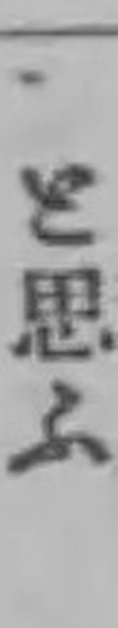と思ふ
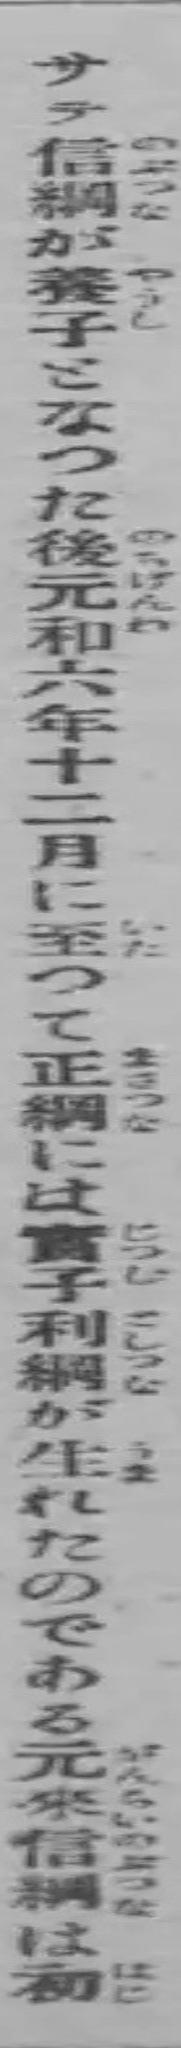サテ信綱が養子となつた後元和六年十二月に至つて正綱には実子利綱が生れたのである元来信綱は初
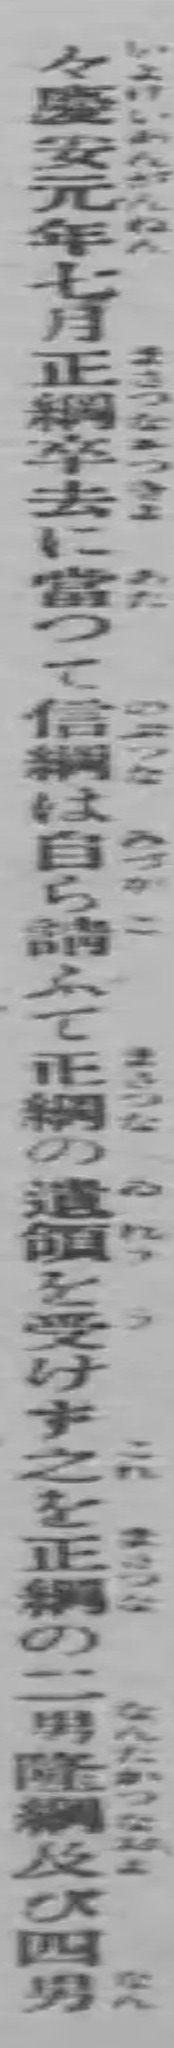愈慶安元年七月正綱卒去に当つて信綱は自ら請ふて正綱の遺領を受けず之を正綱の二男隆綱及び四男
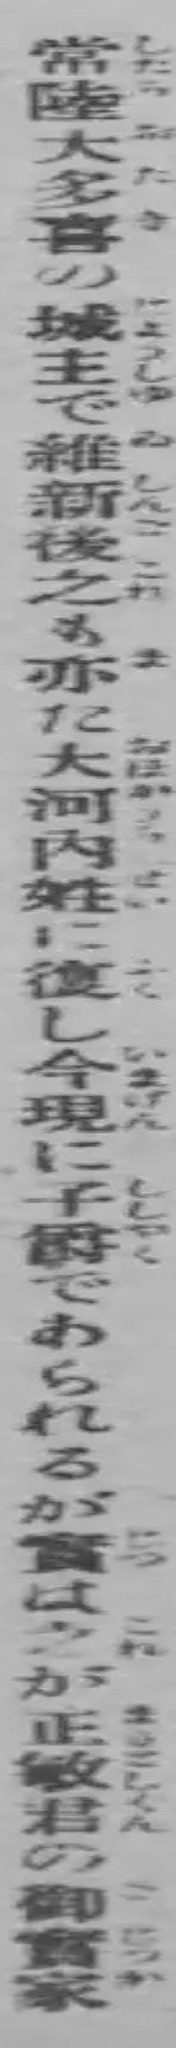常陸大多喜の城主で維新後之も亦た大河内姓に復し今現に子爵であられるが実は之が正敏君の御実家
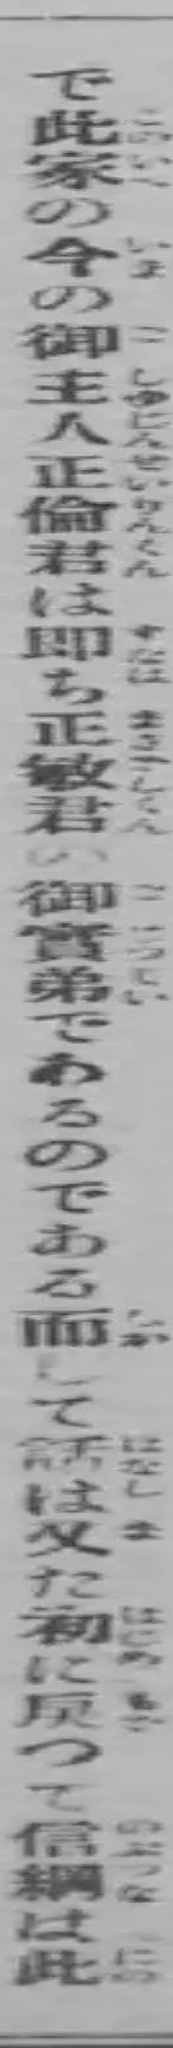で此家の今の御主人正倫君は即ち正敏君の御実弟であるのである而して話は又た初めに戻つて信綱は此
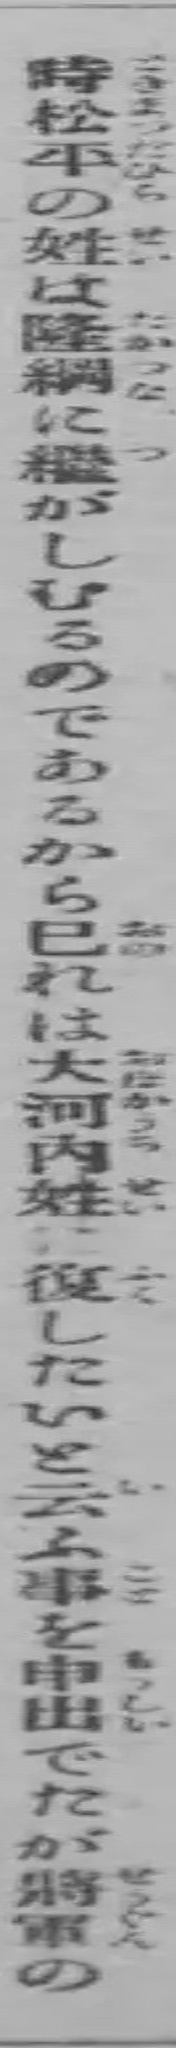時松平の姓は隆綱に継がしむるのであるから巳れは大河内姓に復したいと云ふ事を申出でたが将軍の
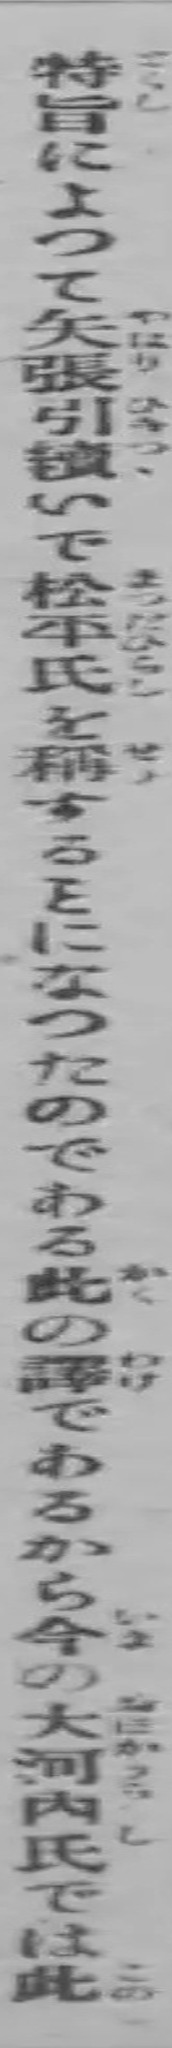特旨によつて矢張引続いで松平氏を称することになつたのである此の訳であるから今の大河内氏では此
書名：豊橋市史談
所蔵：国立国会図書館 National Diet Library, JAPAN
